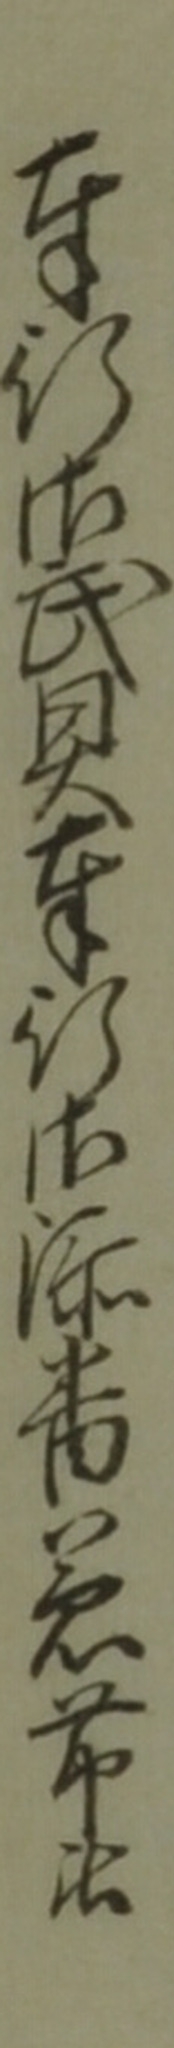奉行御武具奉行御添番兼帯被
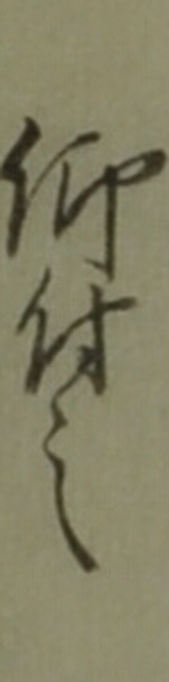仰付之
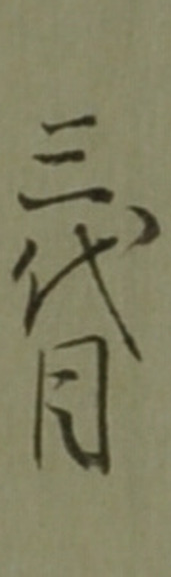三代目
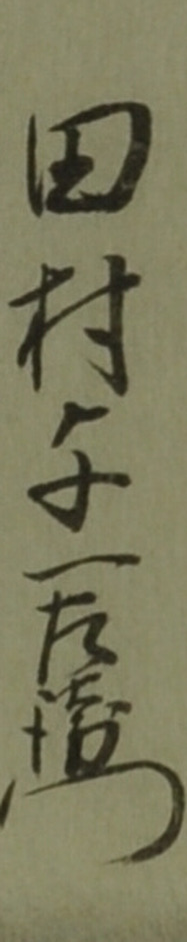田村与一左衛門
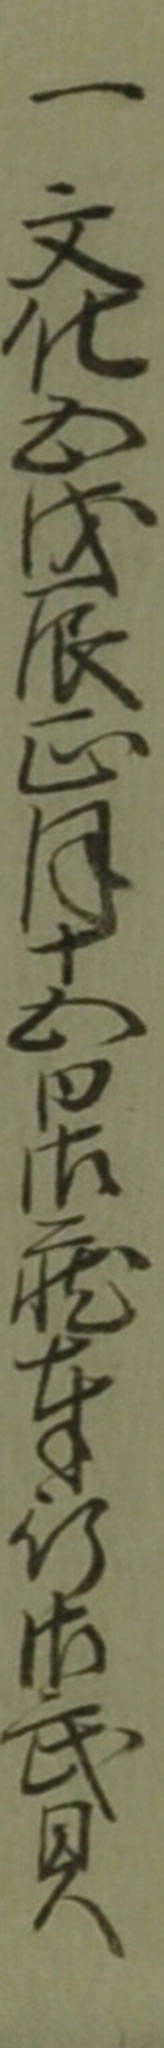一文化五戊辰正月十五日御蔵奉行御武具
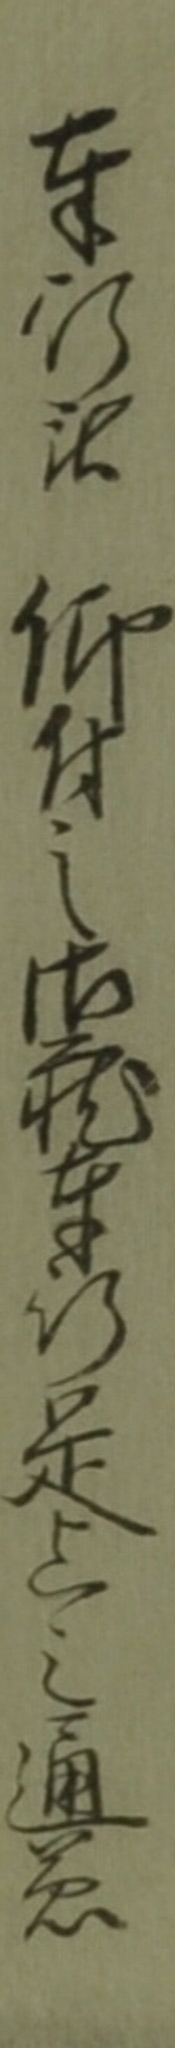奉行被仰付之御蔵奉行是迄之通兼
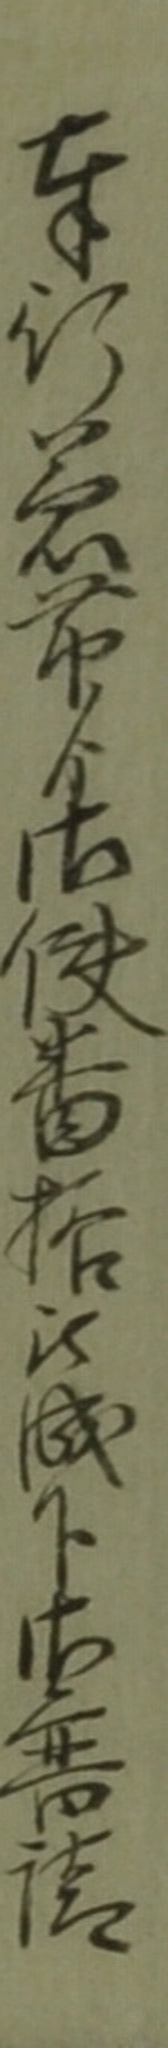奉行兼帯ゟ御使番格被成下御普請
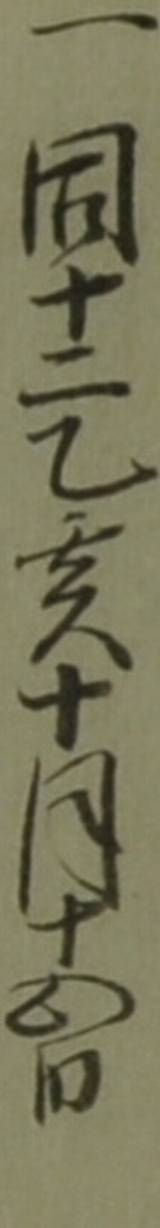一同十二乙亥十月十五日
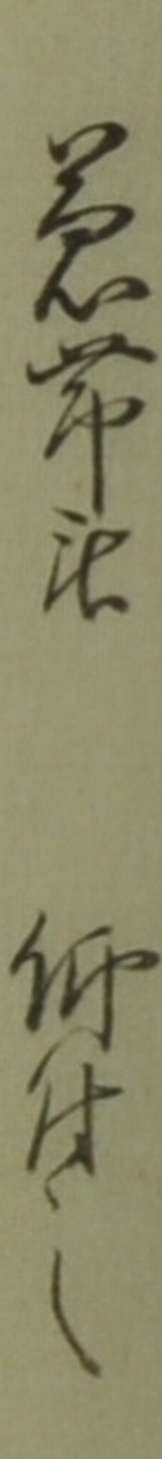兼帯被仰付之
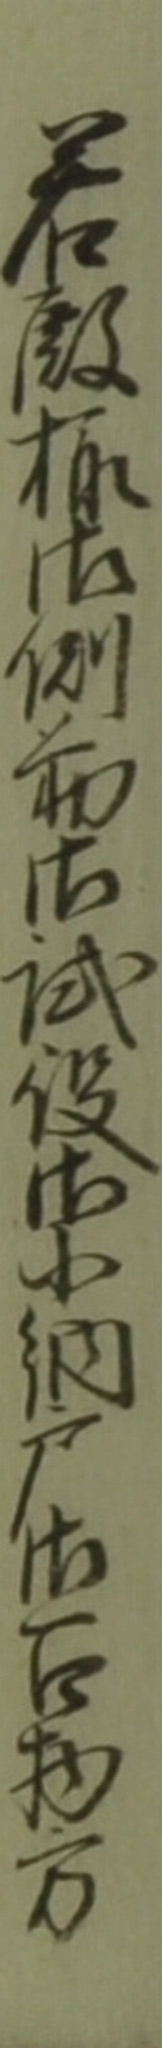若殿様御側勤御試役御小納戸御召物方
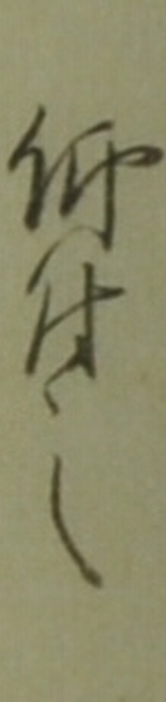仰付之

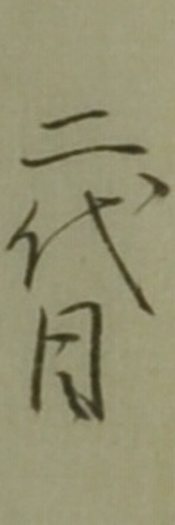二代目
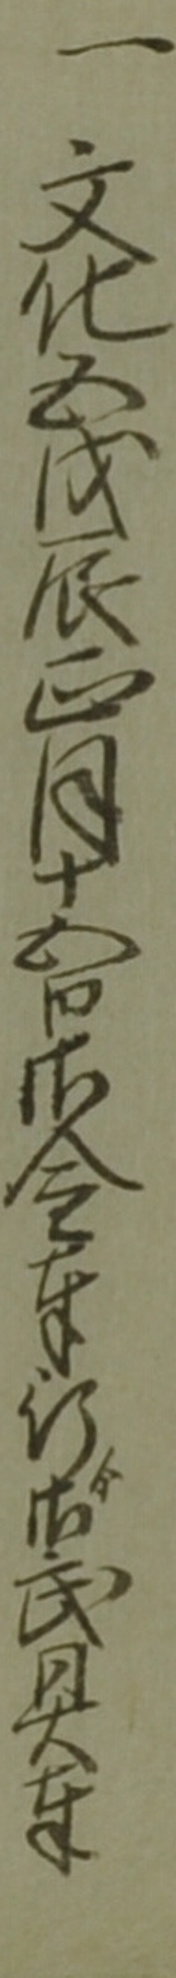一文化五戊辰正月十五日御金奉行ゟ御武具奉
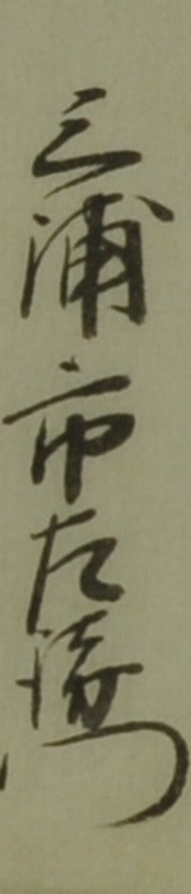三浦市左衛門
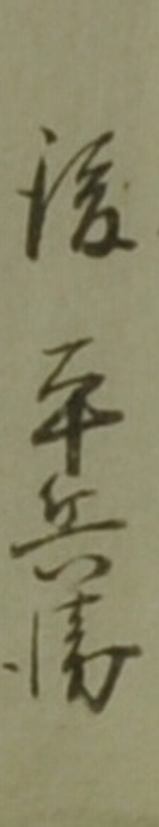後平兵衛
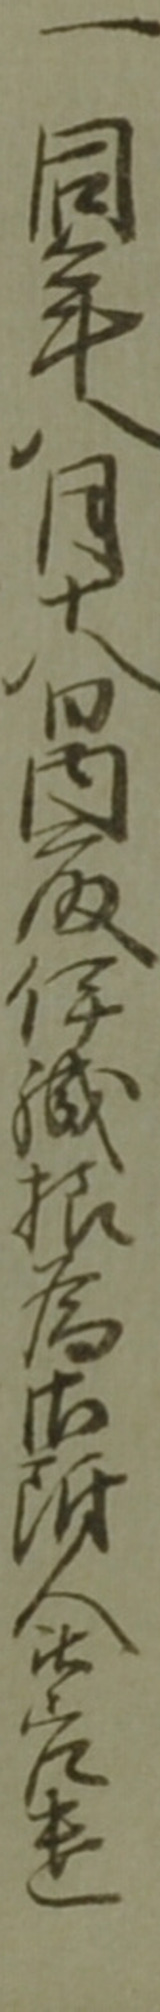一同年八月十八日内藤伊織様為御附人被差遣
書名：諸御役代々録（六）
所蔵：伊那市立高遠町図書館・合同会社AMANE
